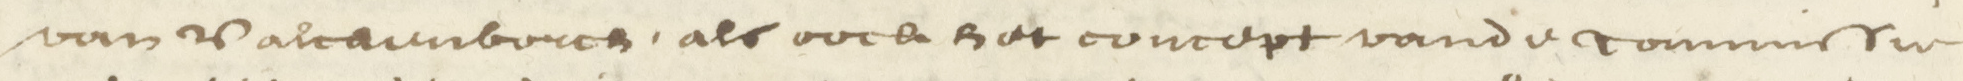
van Valckenborch, als oock het concept vande commissie
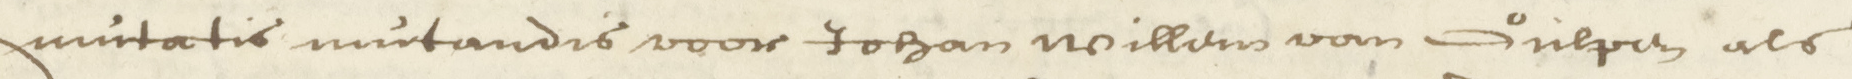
mutatis mutandis voor Johan Willem van Gulpen als
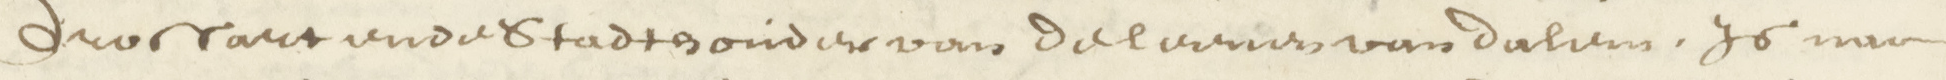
drossart ende Stadthouder van de leenen van dalem. Is nae
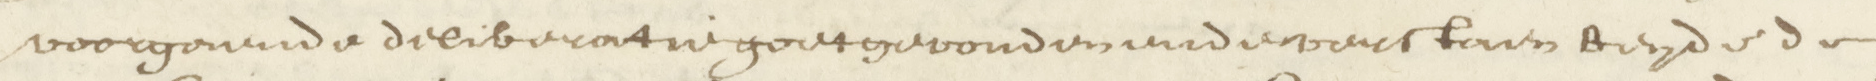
voorgaende deliberatie goetgevonden ende verstaen beyde de
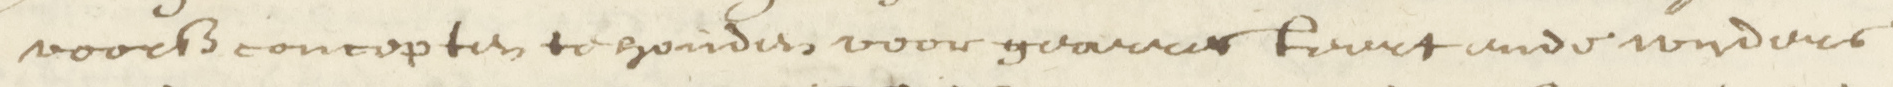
voors concepten te houden voor gearresteert ende wyders
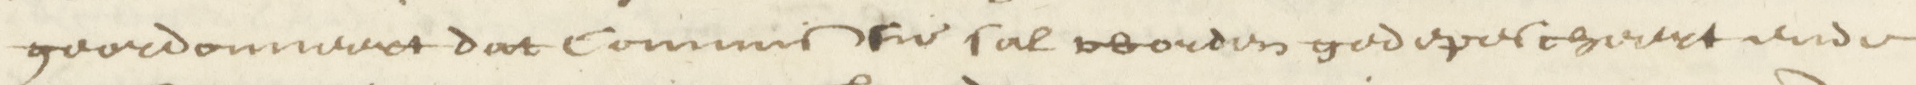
geordonneert dat commisssie sal worden gedepescheert ende
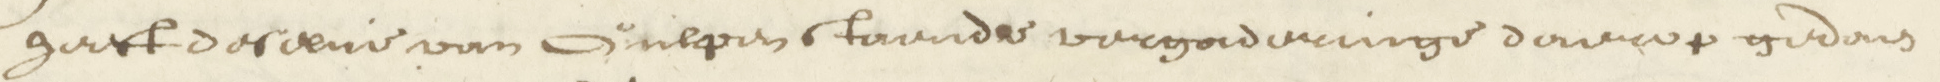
heeft deselue van Gulpen staende vergaderinge daerop gedaen
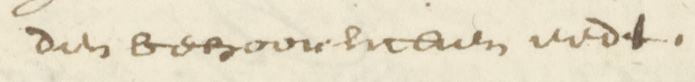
den behoorlicken eedt.
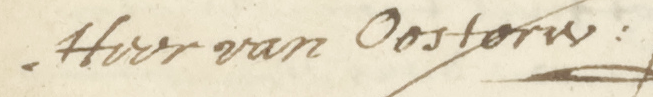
Heer van Oosterw:
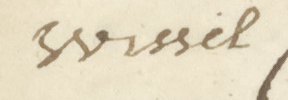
Wissel
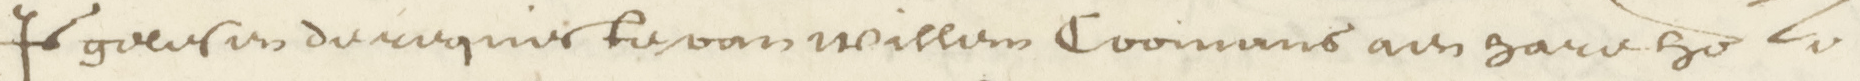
Is gelesen de requeste van Willem Coomans aen hare Ho:Mo
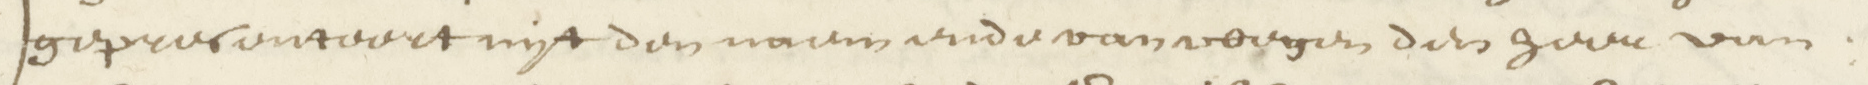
gepresenteert uyt den naem ende van wegen den heer van
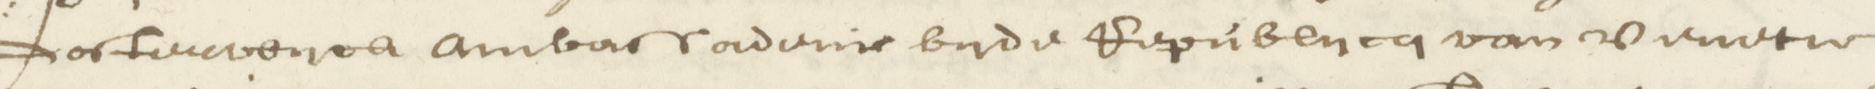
Oosterwyck Ambassadeur byde Republycq van Venetie
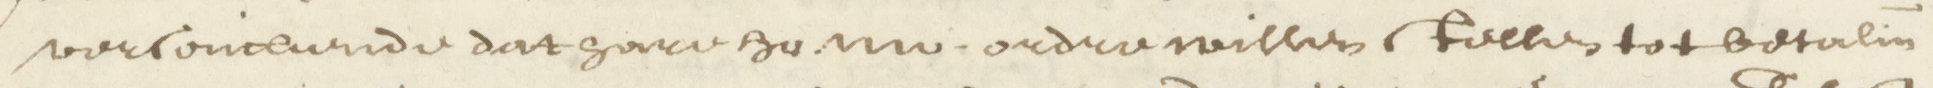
versouckende dat hare Ho:Mo: ordre willen stellen tot betalin
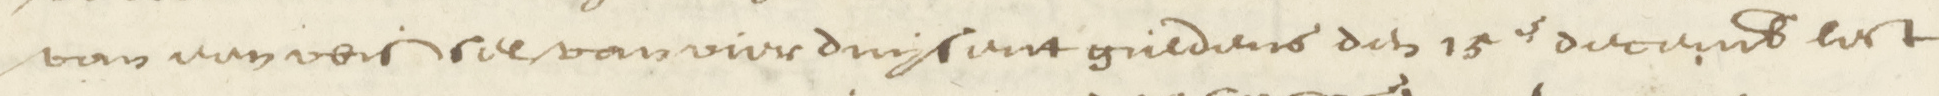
van een wissel van vier duysent guldens den 15en decemb lest
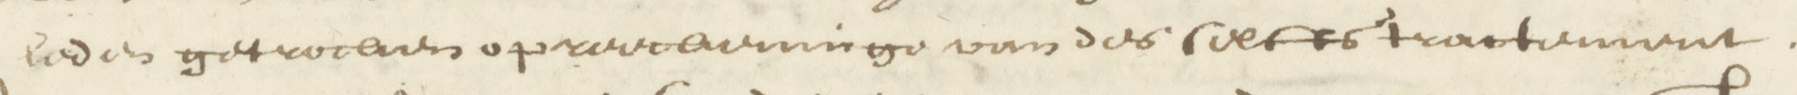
leden getrocken op reeckeninge van des selffs tractement.
